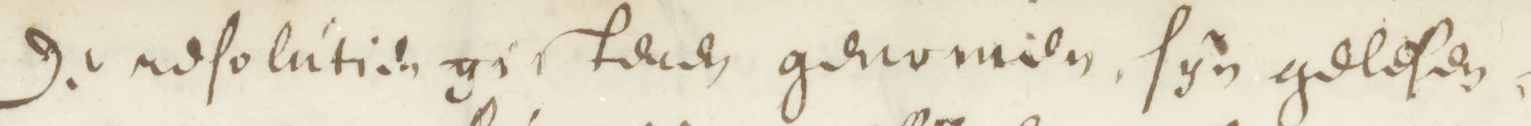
De resolutien gisteren genomen, sijn gelesen,
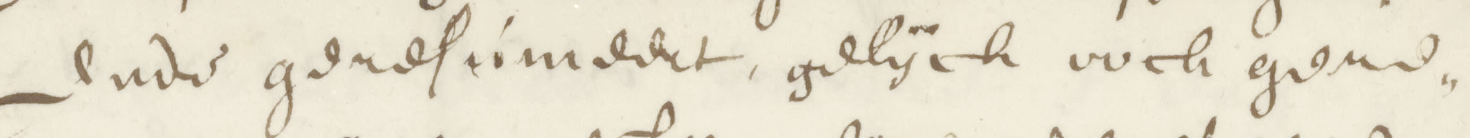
ende geresumeert, gelijck oock gere„
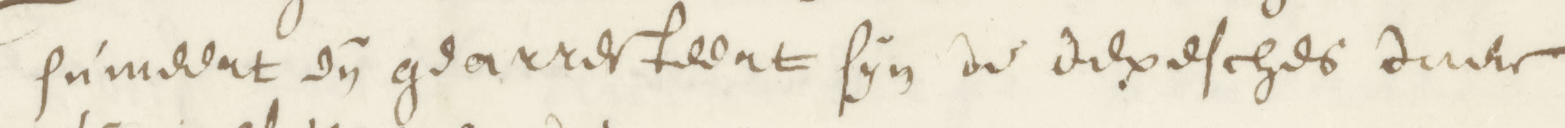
sumeert en gearresteert sijn de depesches daer
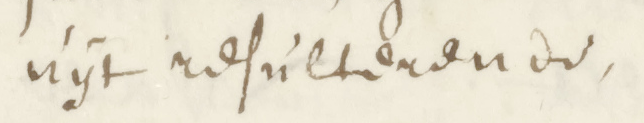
uijt resulterende.
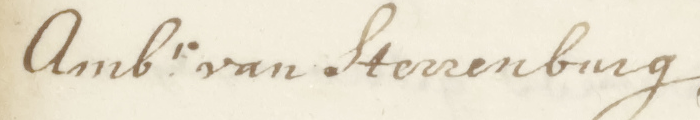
Ambr. van Sterrenburg
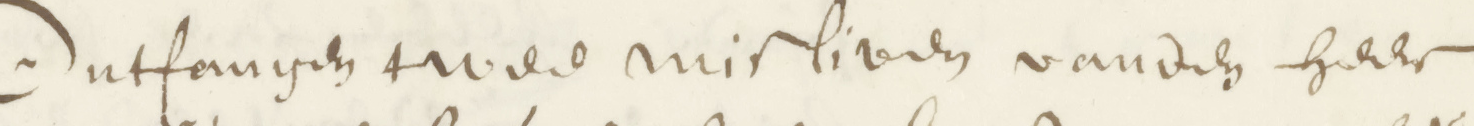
Ontfangen twee missiven vanden heer
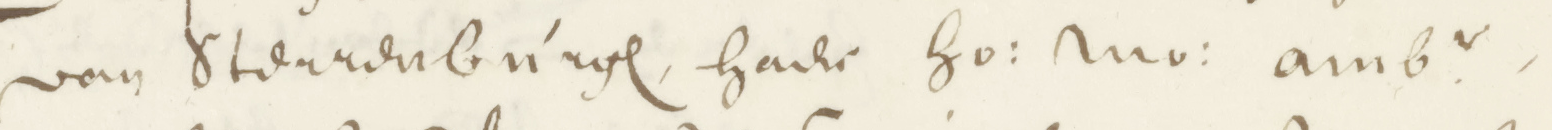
van Sterrenburgh, haer ho:Mo: ambr.
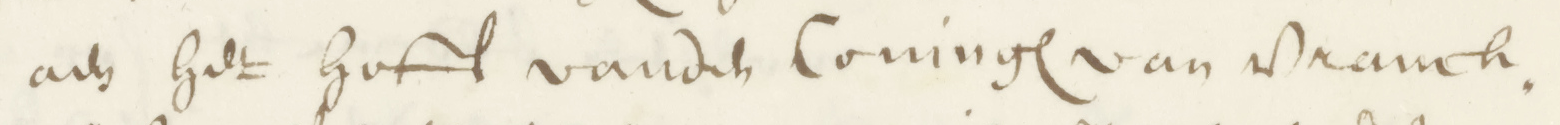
aen het hoff vanden Coningh van Vranck„
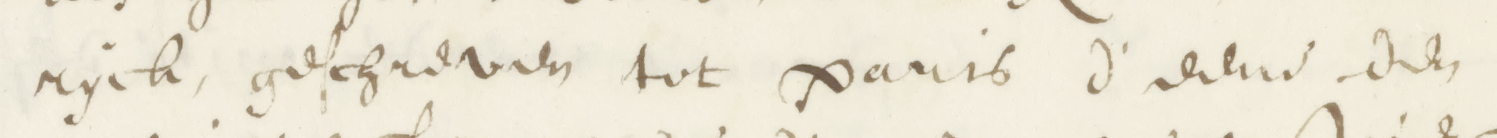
rijck, geschreven tot paris d‛eene den
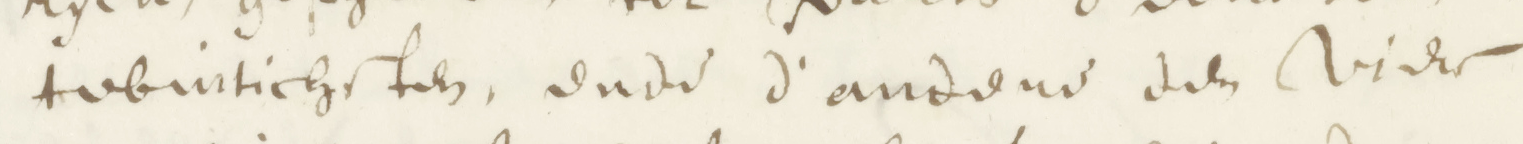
twintichsten, ende d‛andere den vier
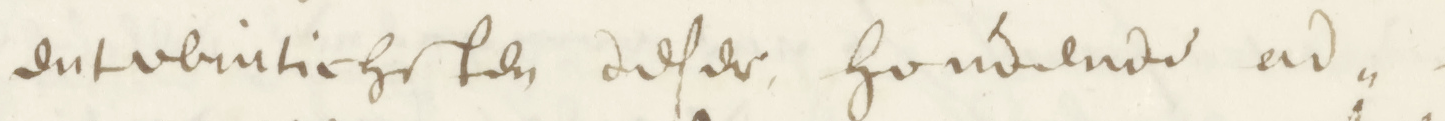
entwintichsten deser, houdende ad„
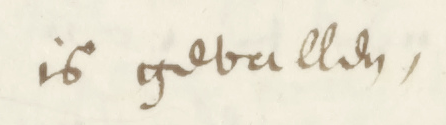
is gevallen.
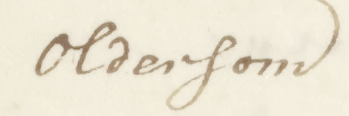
Oldersom
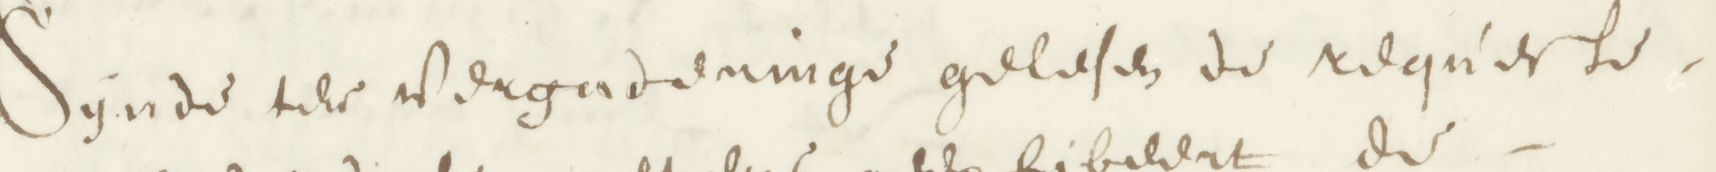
Sijnde ter vergaderinge gelesen de requeste
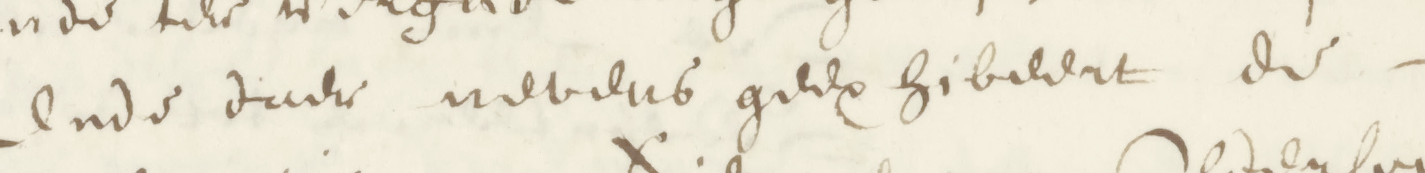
ende daer nevens geexhibeert de
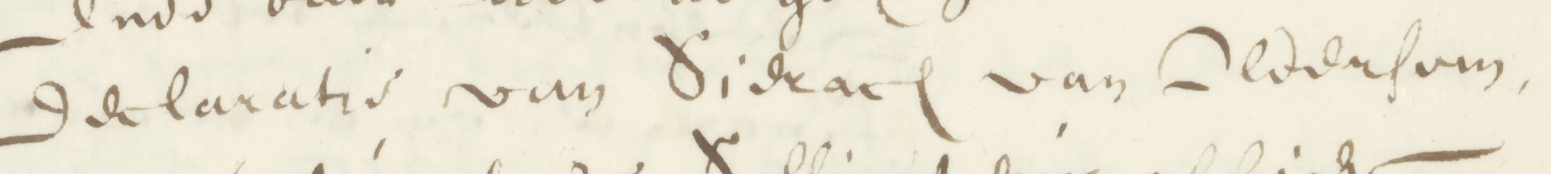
Declaratie van Sierach van Oldersom,
